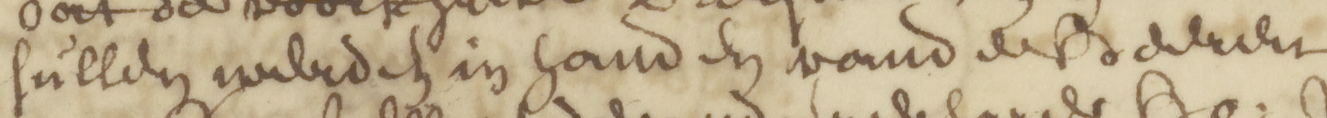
sullen werden in handen vande Heeren
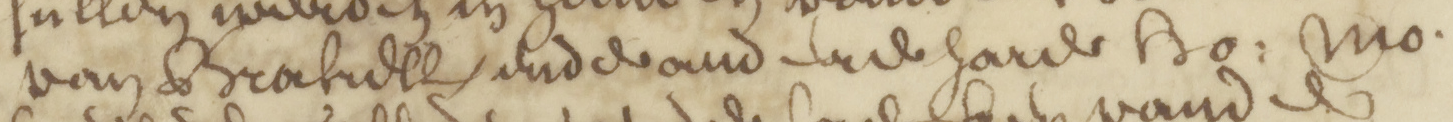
van Brakell, ende andere hare Ho:Mo:
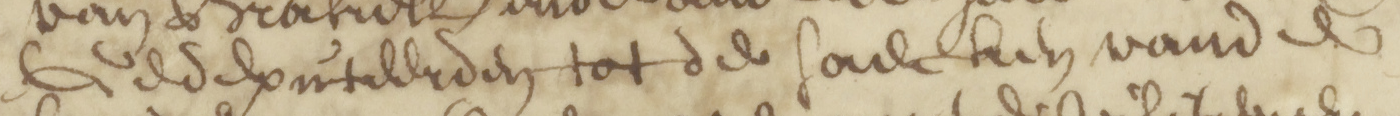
Gedeputeerden tot de saecken vande
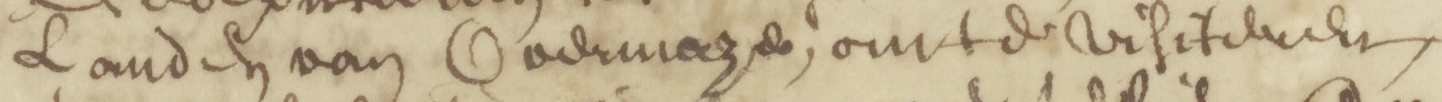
Landen van Overmaze, om te visiteren,
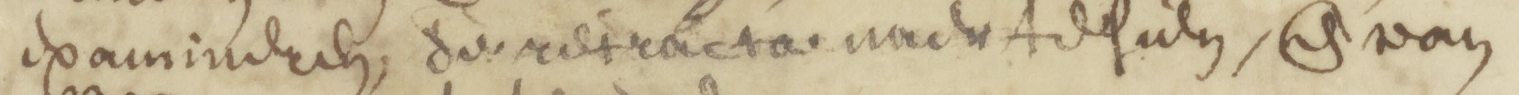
examineren, de retracta naer tesien, & van
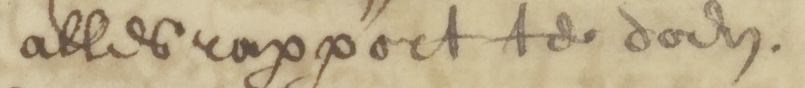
alles rapport te doen.
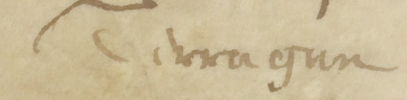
Terragun
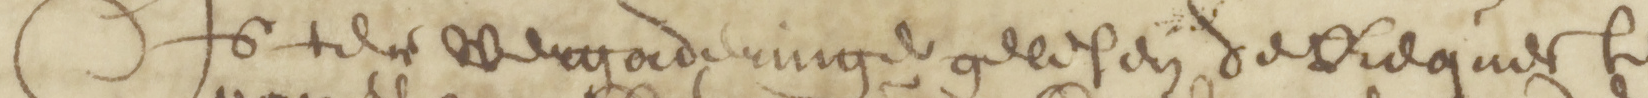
Is ter Vergaderinge gelesen de Requeste
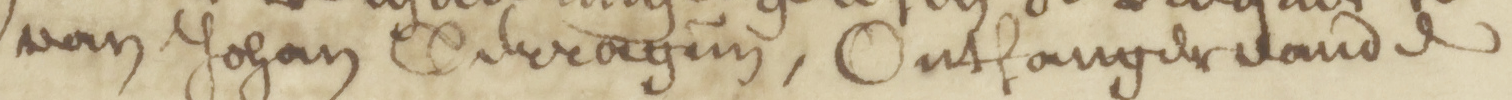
van Johan Terragun, Ontfanger vande
